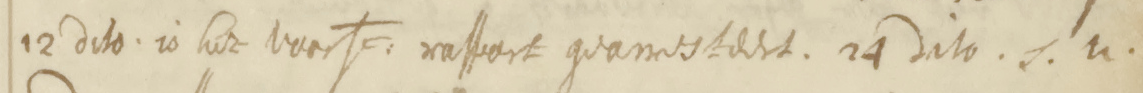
12 dito is het voorsc: rapport gearresteert. 24 dito s.n.
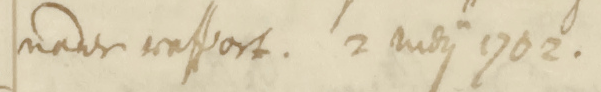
nader rapport. 2 meij 1702.
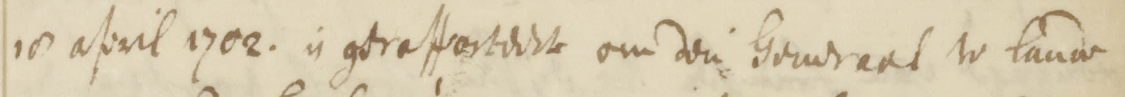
18 april 1702. is gerapporteert om den Generaal te lande
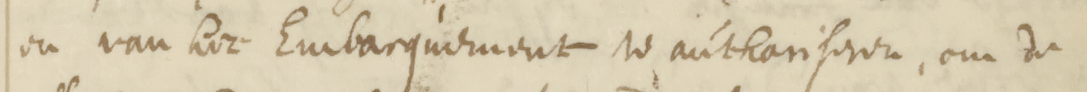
en van het Embarquement te authoriseren, om de
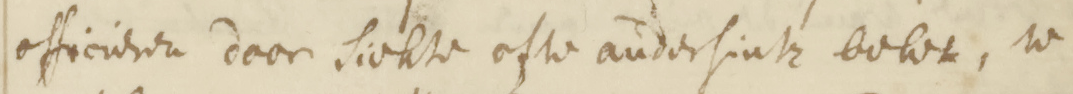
officieren door siekte ofte andersintz belet, te
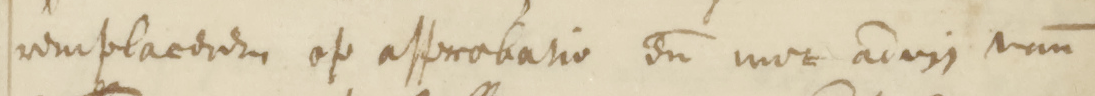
remplaceren op approbatie en met advis van
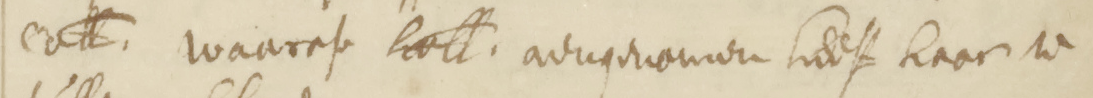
coll. waarop holl. aengenomen heeft haar te
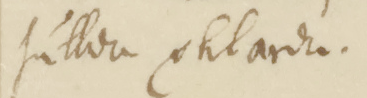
sullen vclaren.
